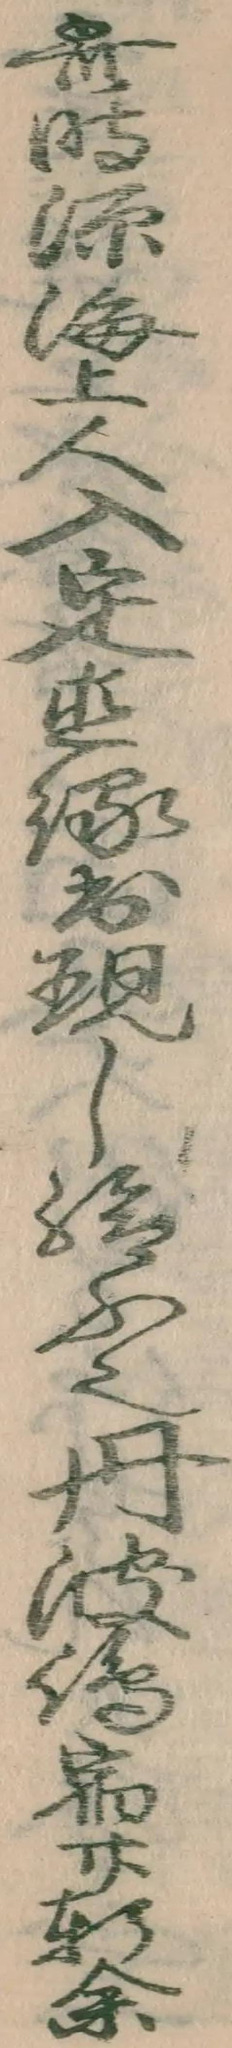此時源海上人入定直縁出現し給ふ也丹波嶋宿廿軒余
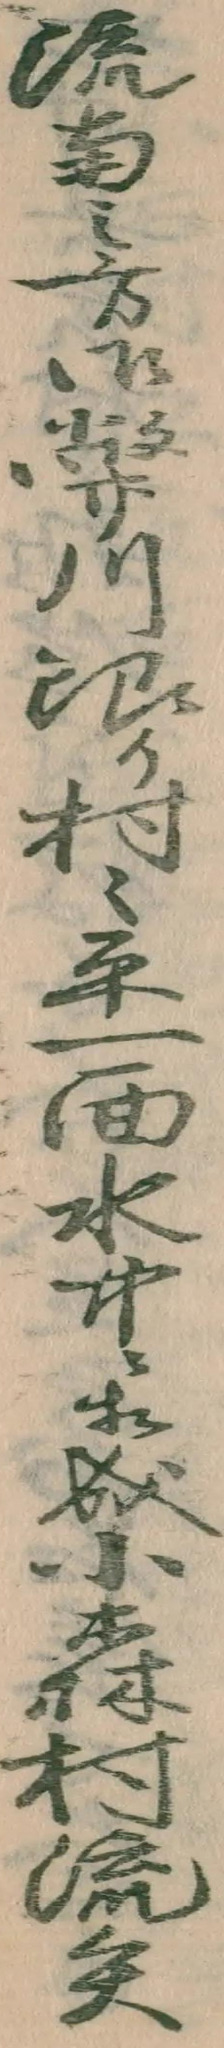流南之方御幣川限り村々平一面水中二相成小森村流失
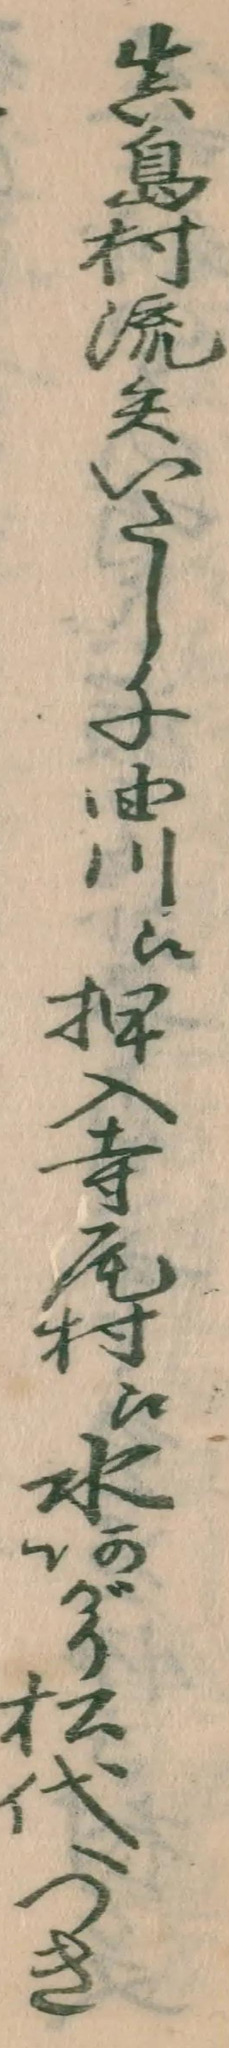真島村流失いたし千曲川江押入寺尾村江水あがり松代へつき
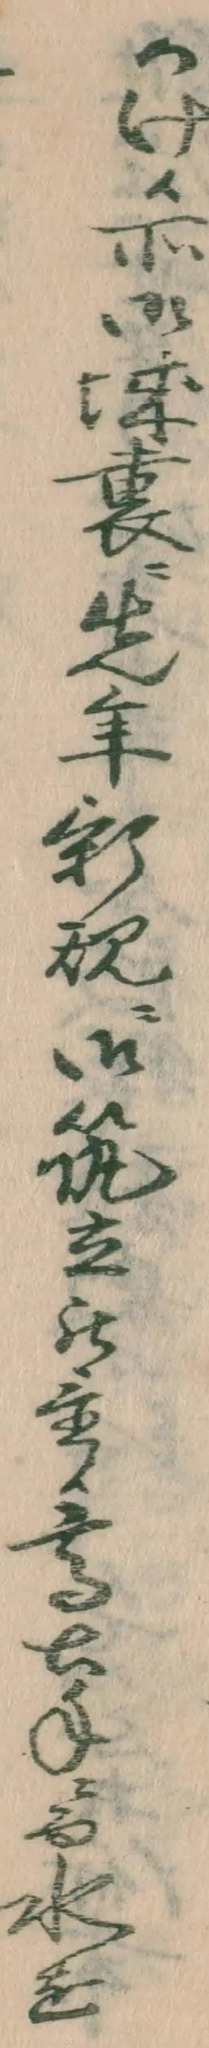かけ候所御城裏二先年新規二御筑立罷置候高土手二而水を
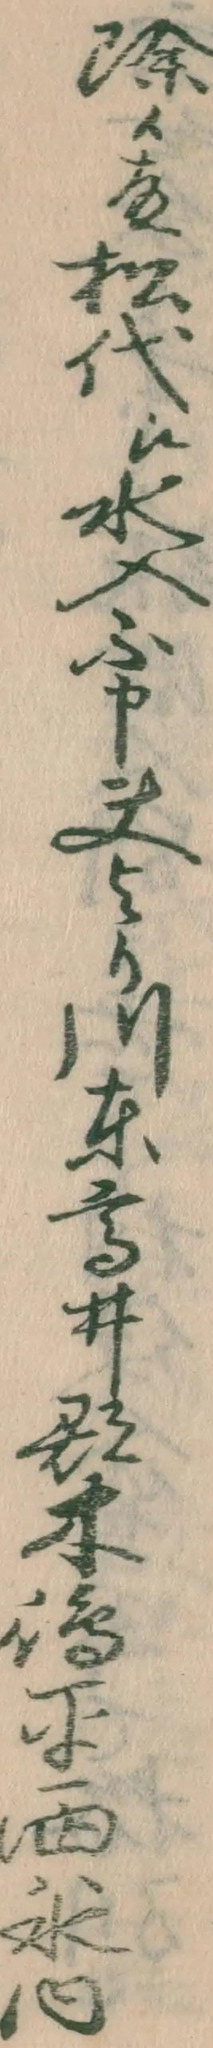除候故松代江水入不申夫より川東高井郡木嶋平西は水内
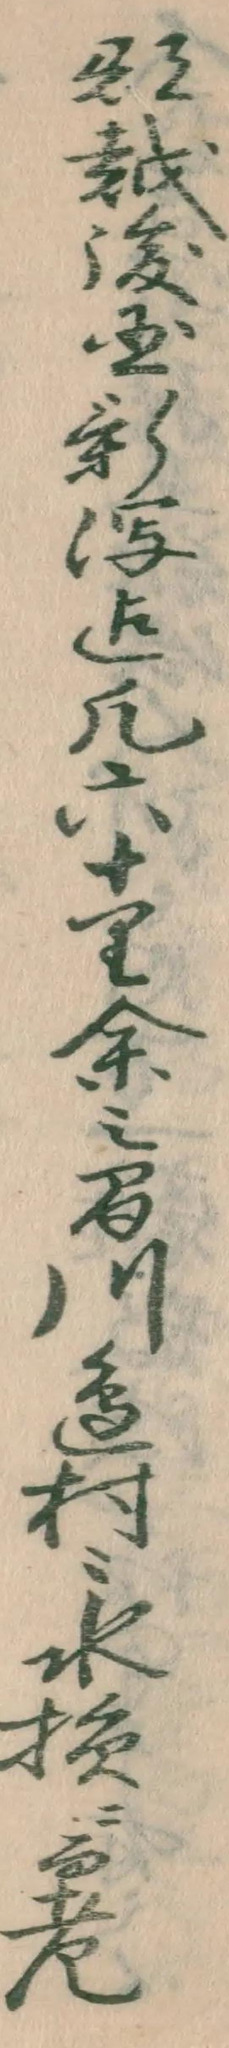郡越後国新潟迄凡六十里余之間川辺村々水損二而老
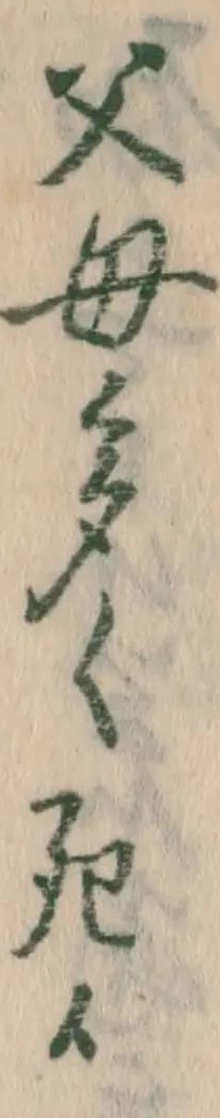父母多く死候
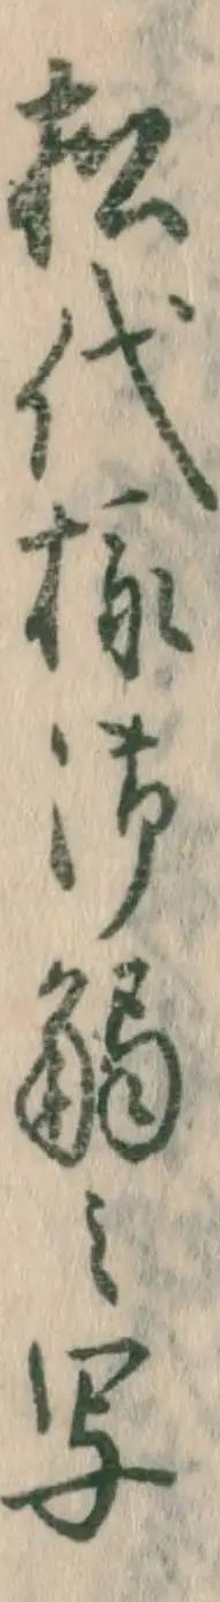松代様御觸之写
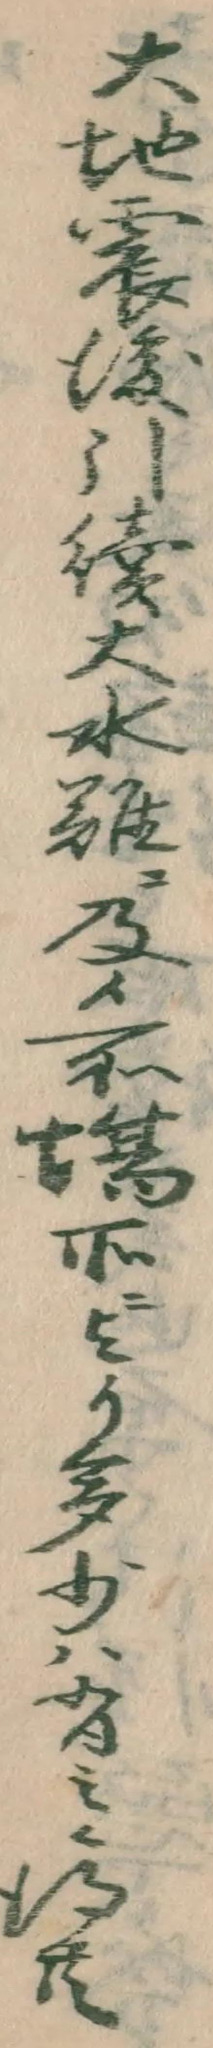大地震後引続大水難二及候所場所二より多少は有之候得共
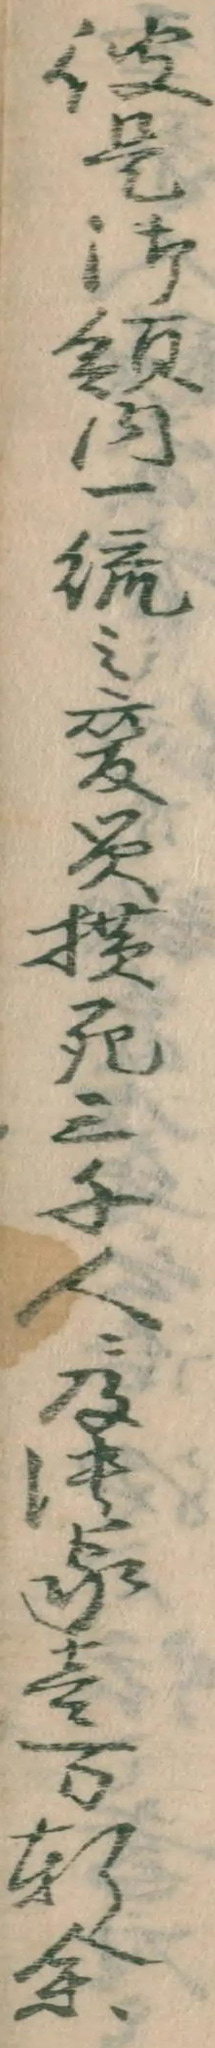彼是御領内一統之変災横死三千人二及潰家壱万軒余

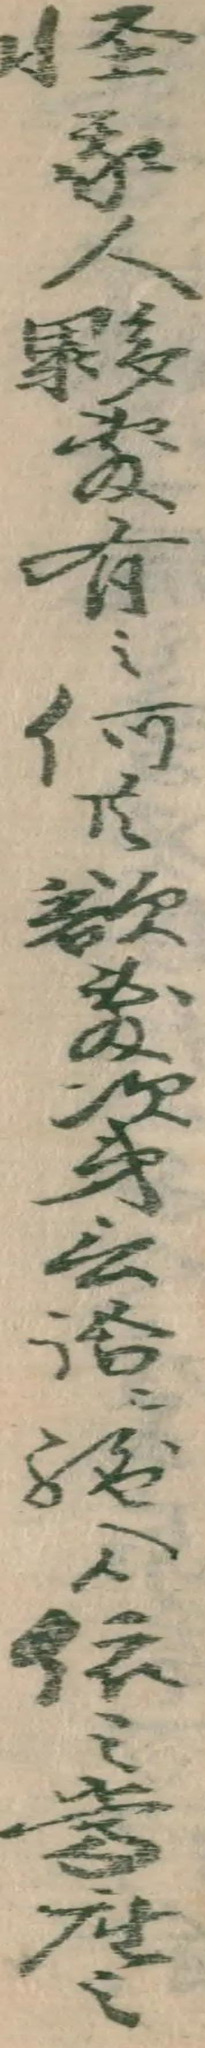怪我人夥敷有之何共歎敷次第言語二絶へ候依之当座之
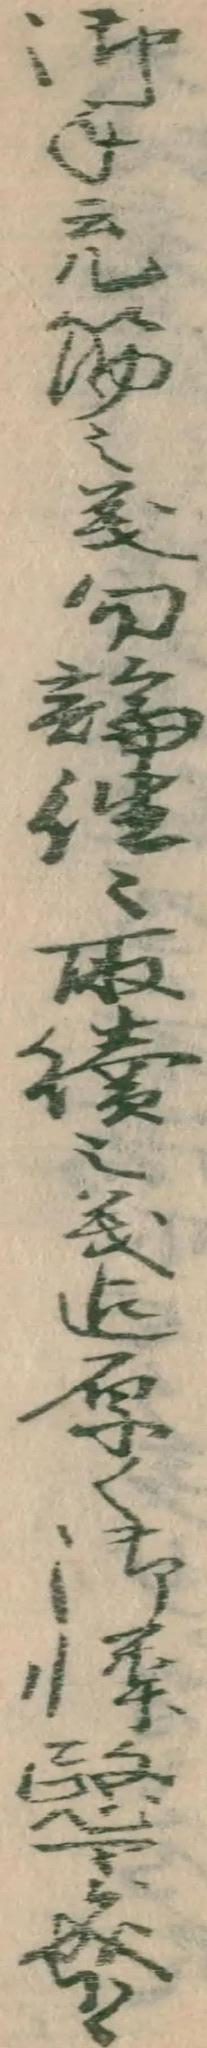御手充筋之義勿論往々取続之義迄厚く御憐愍可被成下候
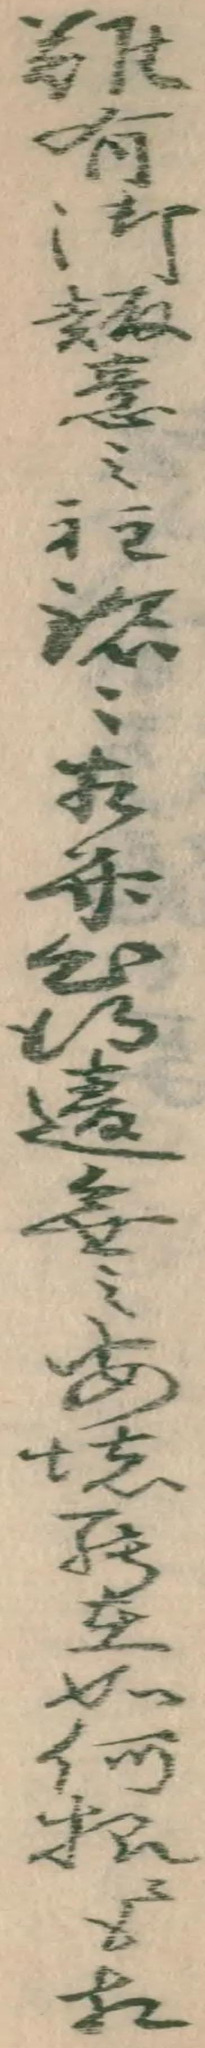難有御趣意之程銘々相弁心得違無之安堵罷在如何様二も相
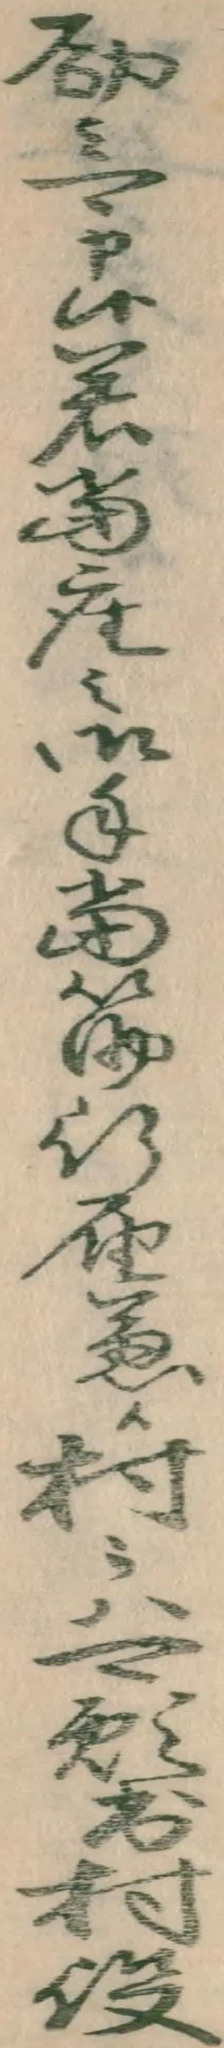励み可申候若当座之御手当筋行届兼候村々は願出村役
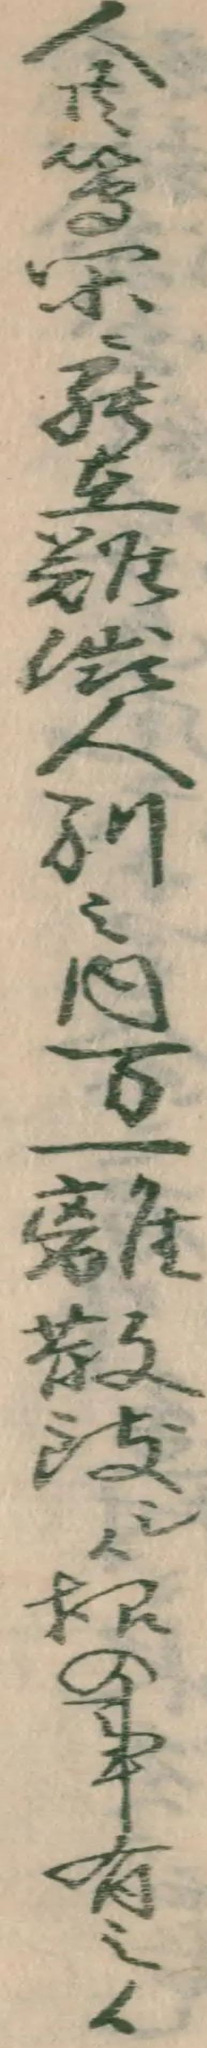人共等閑二罷在難渋人別之内万一離散致ㇱ候様の事有之候
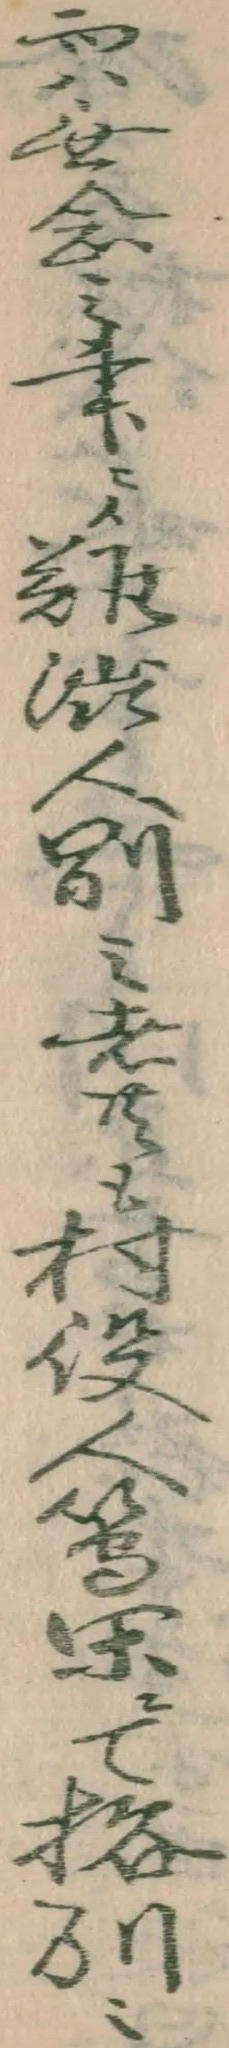而は無念之事二候難渋人別之者共も村役人等閑二て格別之
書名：大地震
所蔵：国立国会図書館 National Diet Library, JAPAN
